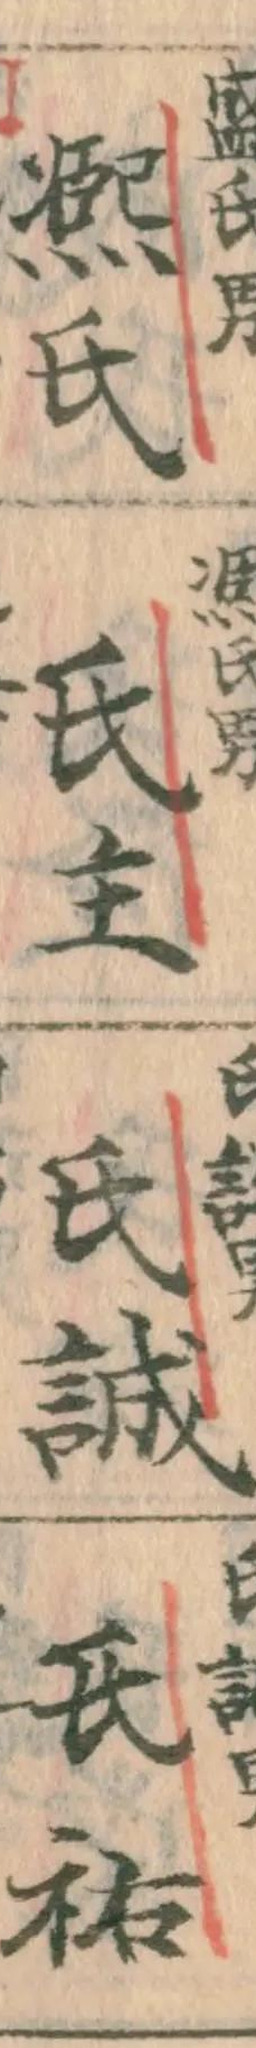凞氏氏主氏誠氏祐
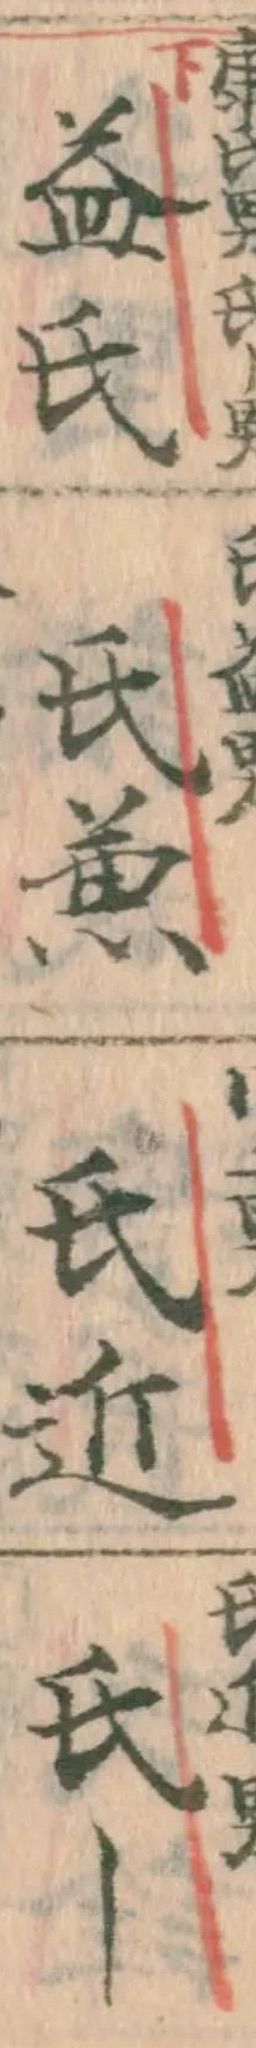益氏氏兼氏近氏ー
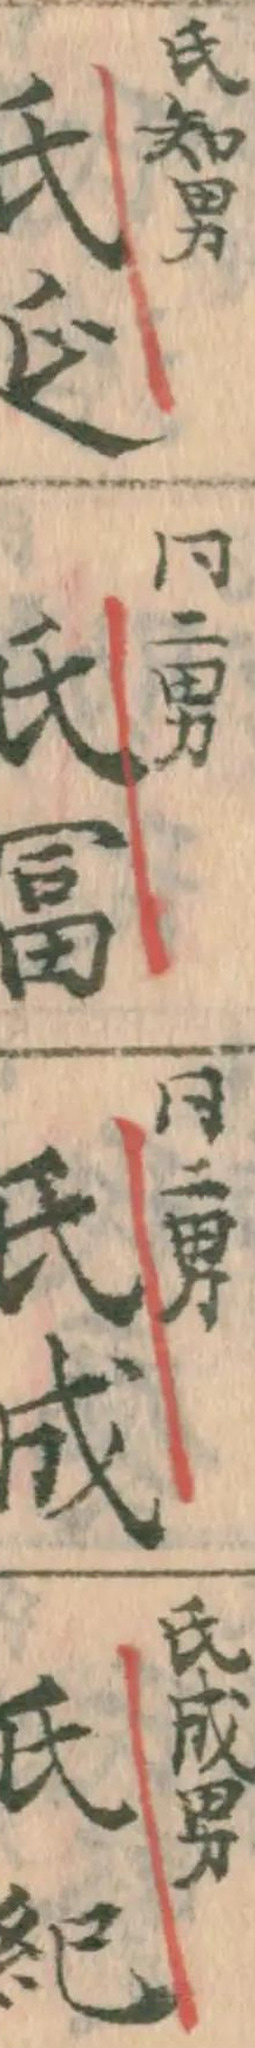氏延氏冨氏成氏紀
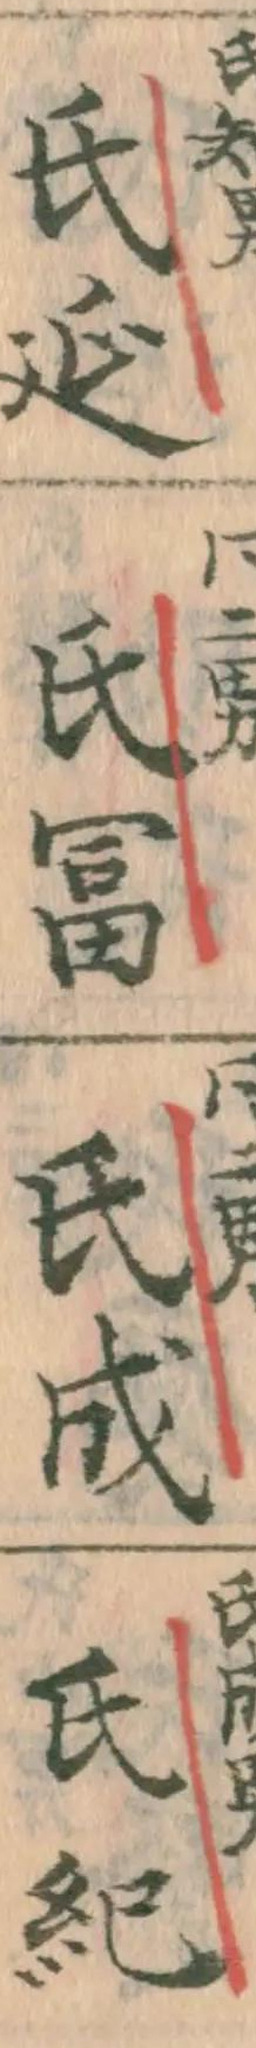氏延氏冨氏成氏紀
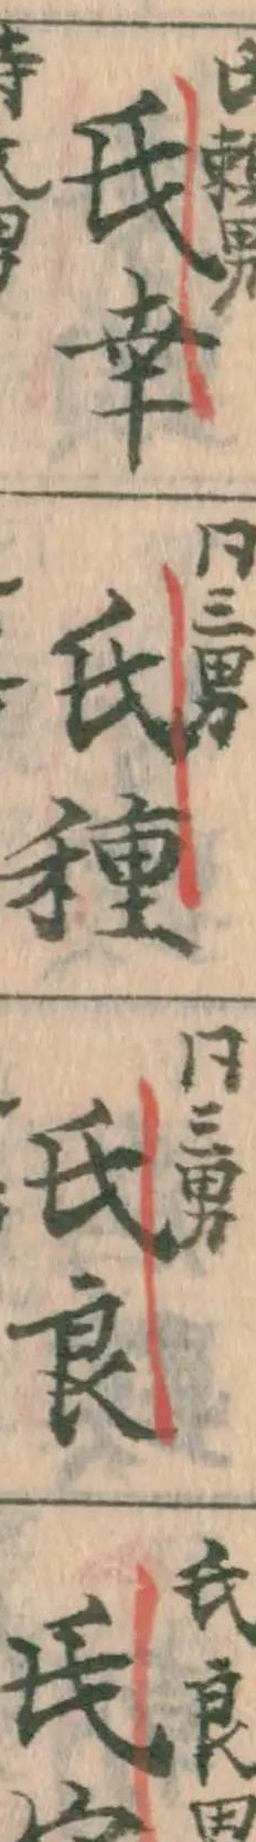氏幸氏種氏良氏守
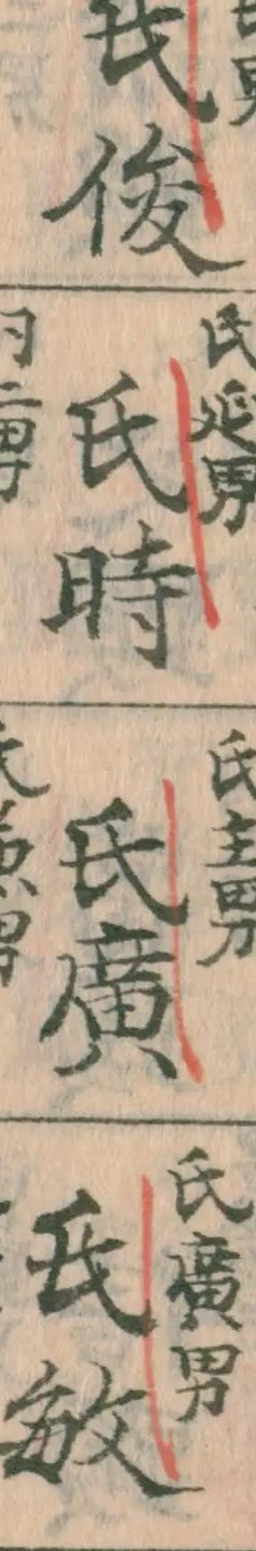氏俊氏時氏廣氏敏
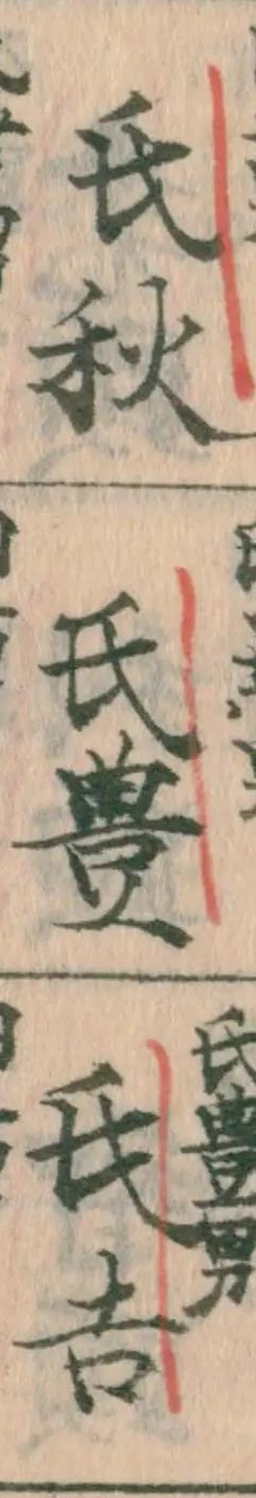氏秋氏豊氏𠮷
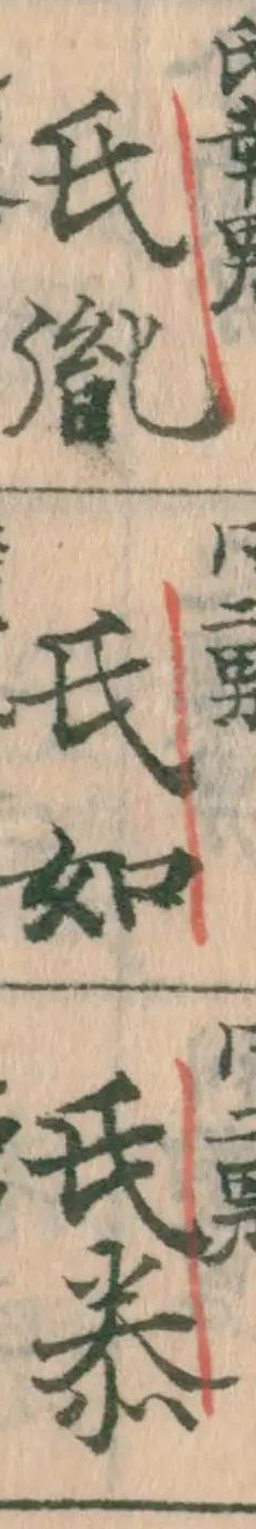氏胤氏如氏恭
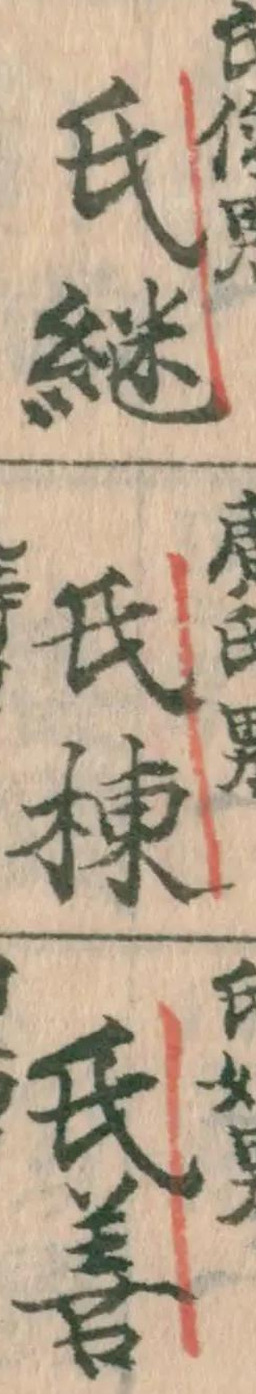氏継氏棟氏善
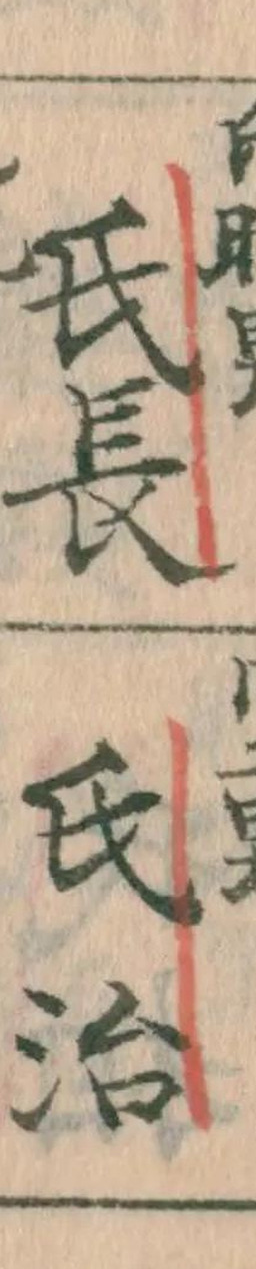氏長氏治
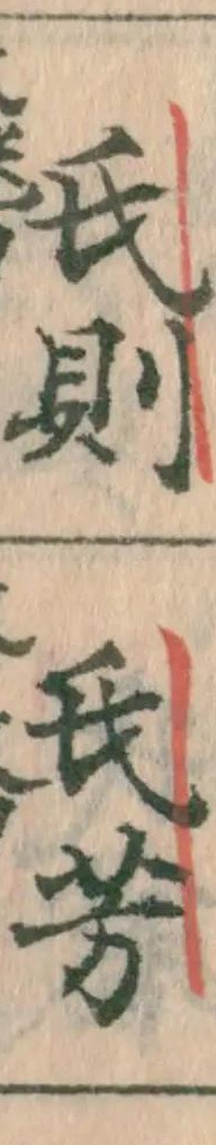氏則氏芳
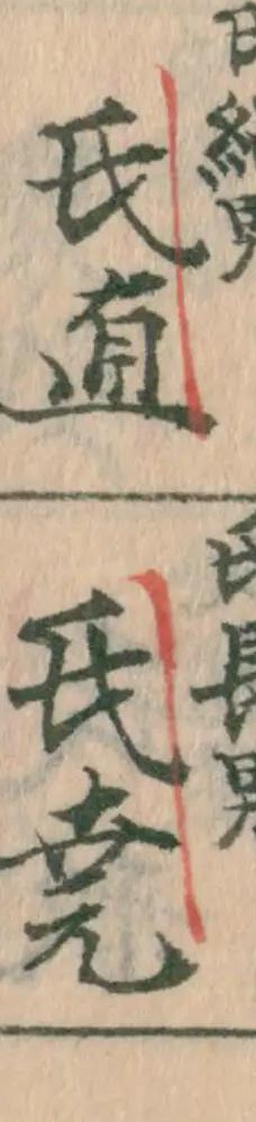氏直氏尭

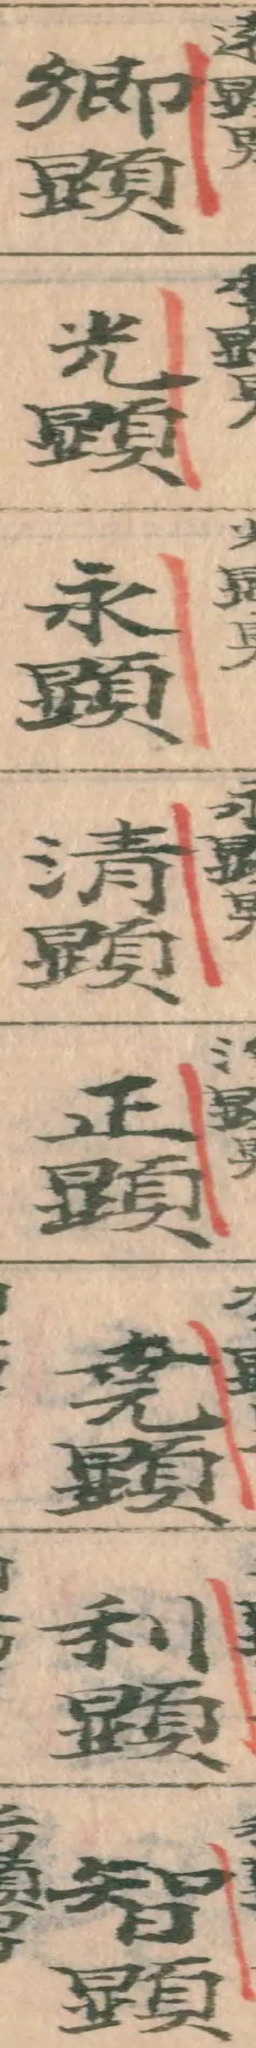郷顕光顕永顕清顕正顕尭顕利顕智顕
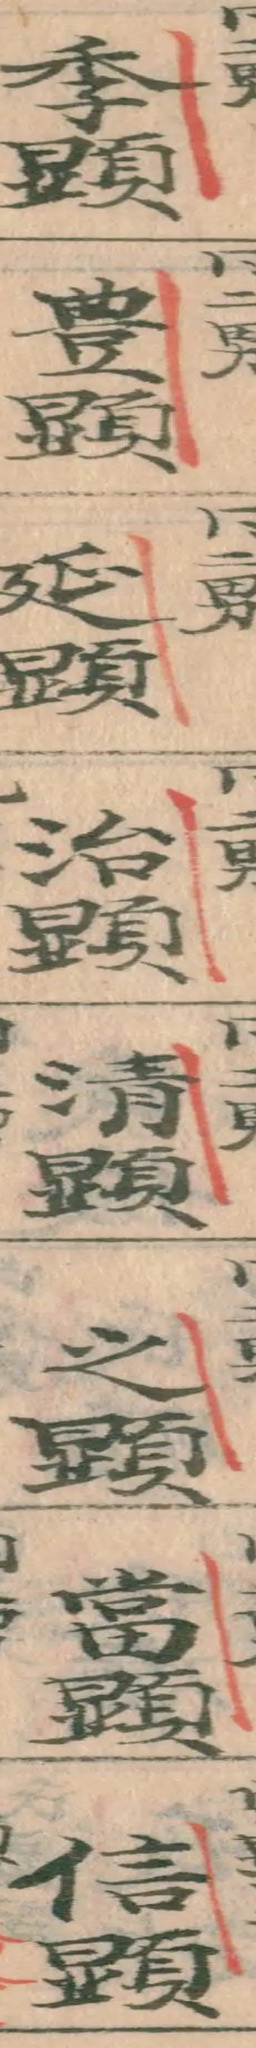季顕豊顕延顕治顕清顕之顕當顕信顕
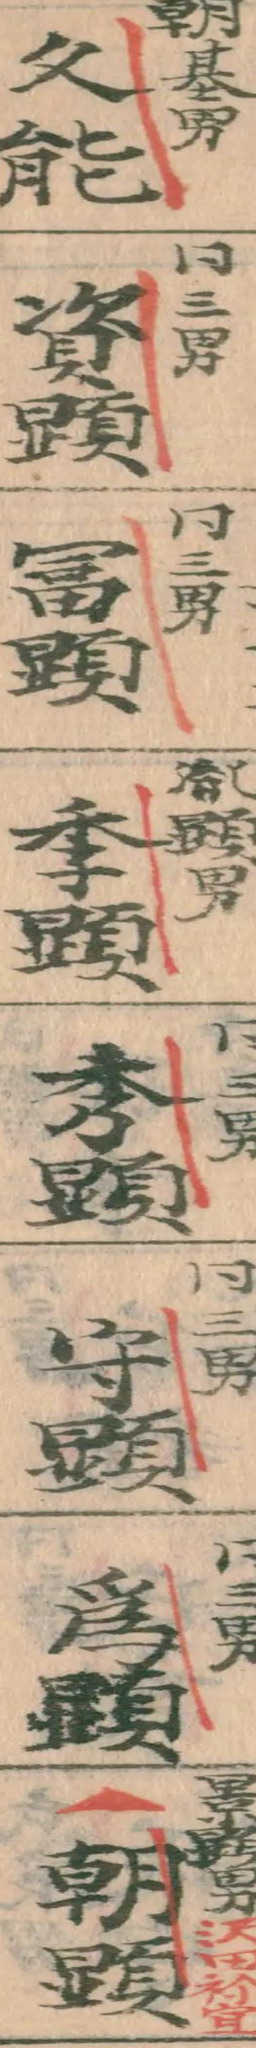久能資顕冨顕季顕秀顕守顕為顕▲朝顕
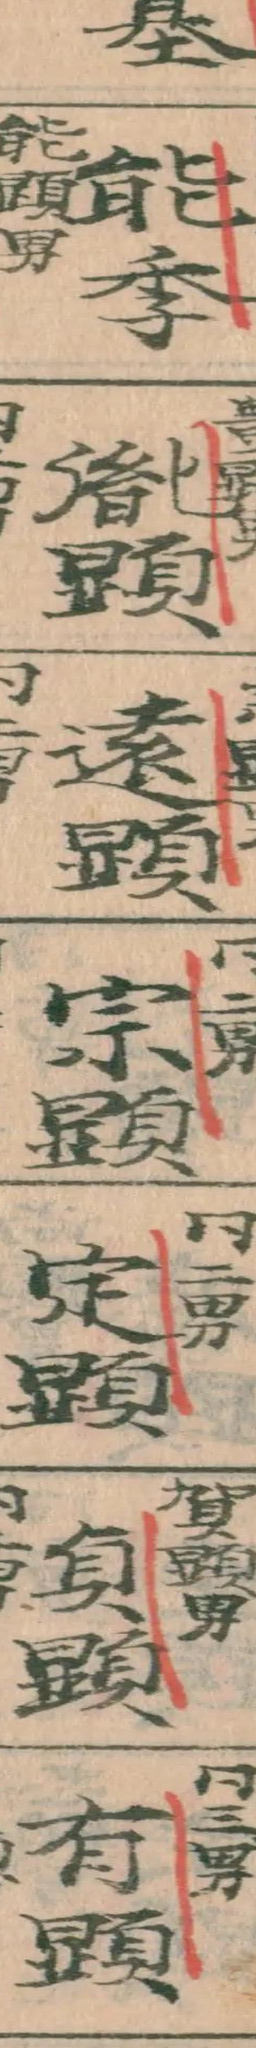顕基能季胤顕遠顕宗顕定顕貞顕有顕
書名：賀茂社記録. 第24冊
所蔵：国立国会図書館 National Diet Library, JAPAN
